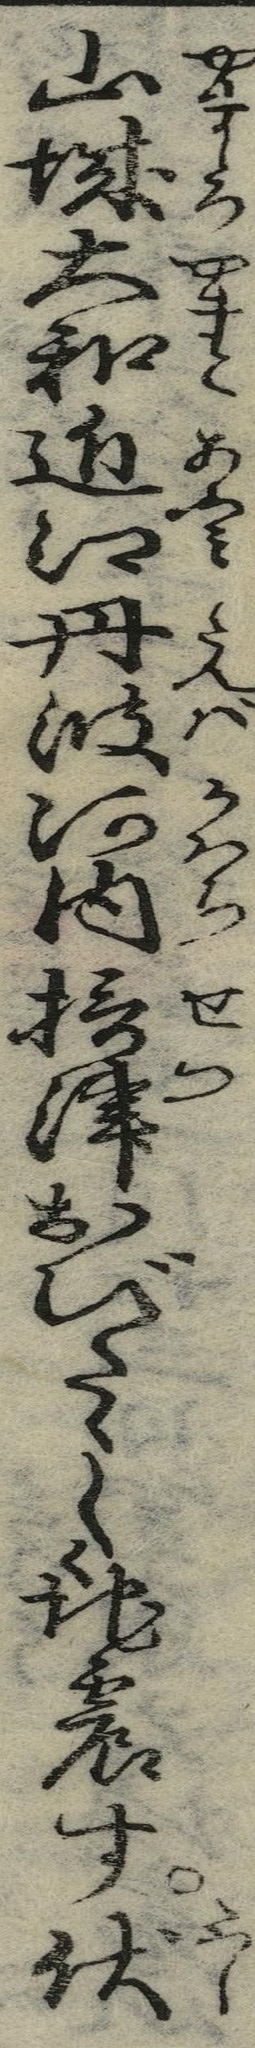山城大和近江丹波河内摂津おびたゝしく地震す。伏
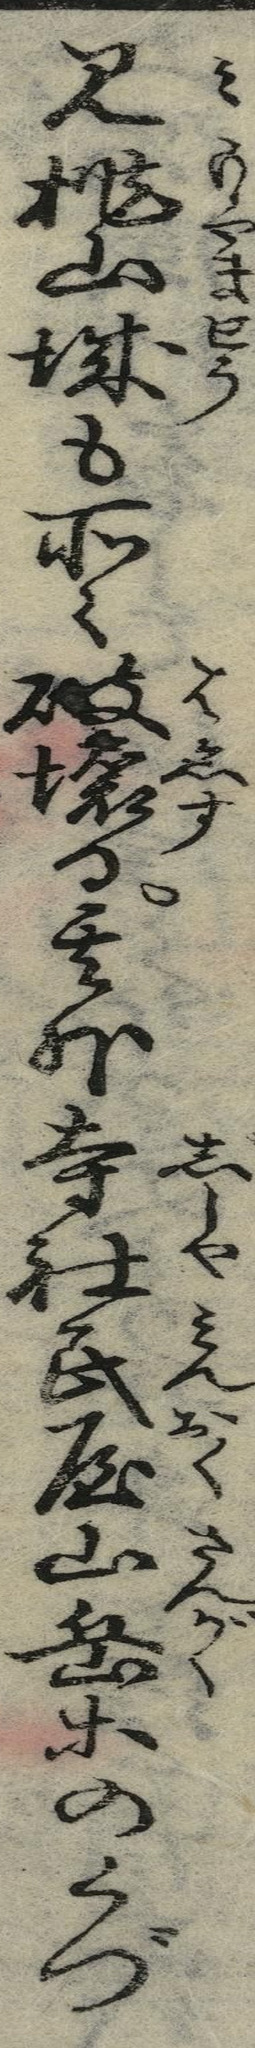見桃山城も所〻破壊る。其外寺社民屋山岳等のくづ
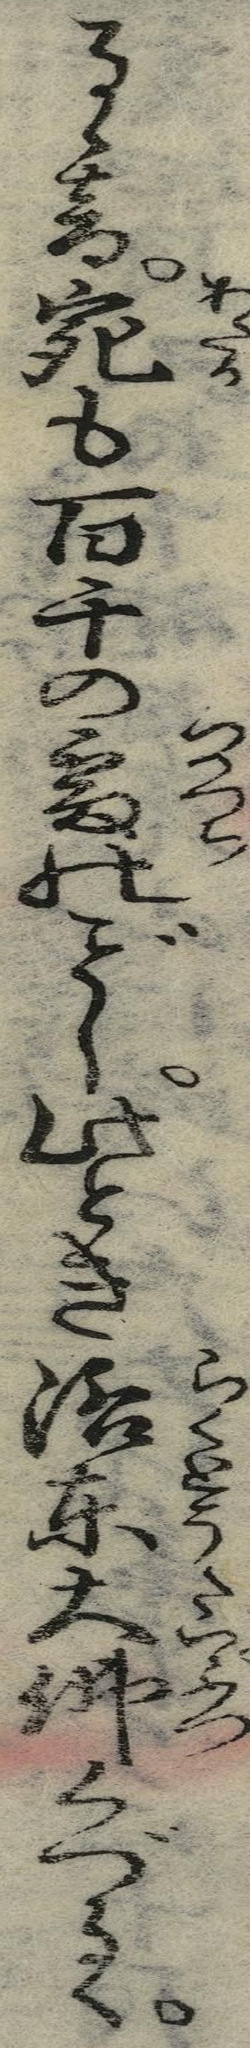るゝ音。宛も百千の雷のごとし。此とき洛東大仏くづるゝ。
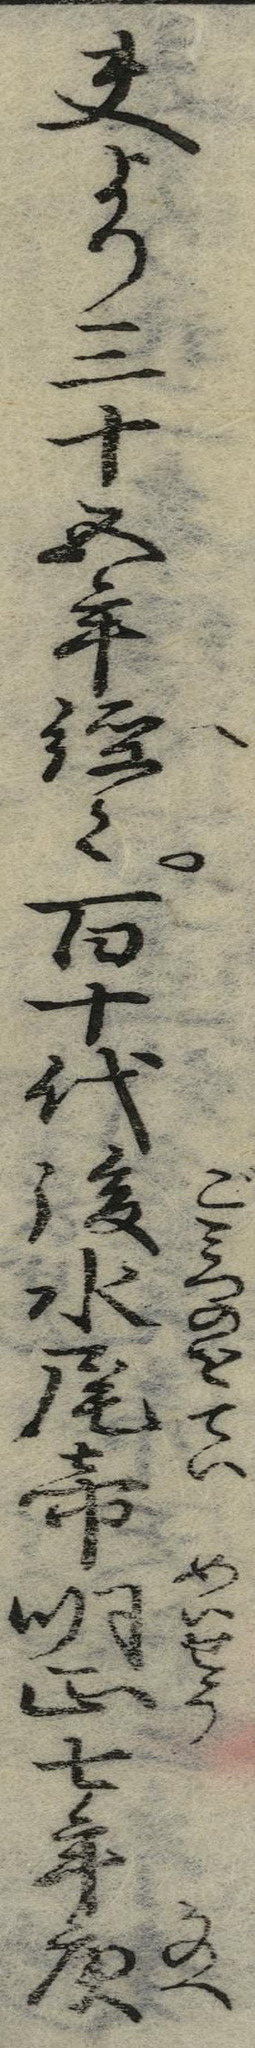夫より三十五年経て。百十代後水尾帝明正七年庚
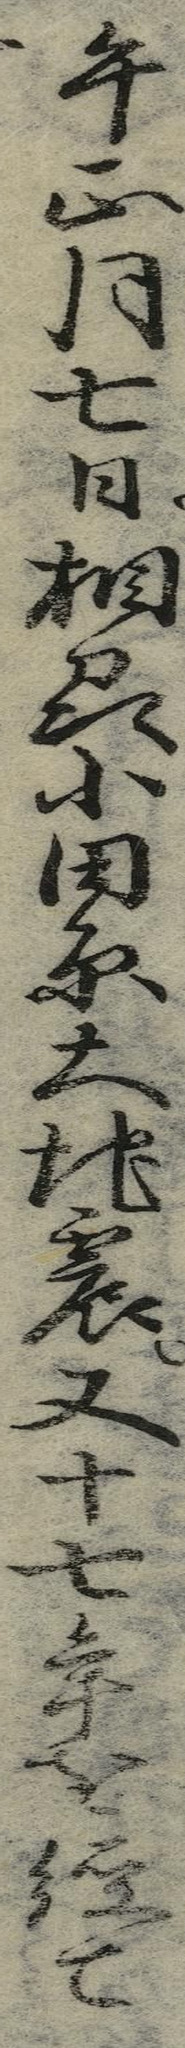午正月七日。相州小田原大地震。又十七年を経て
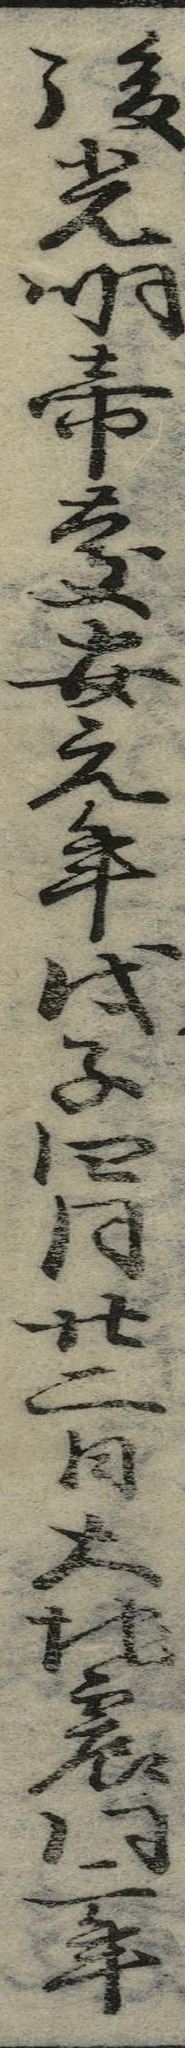後光明帝慶安元年戊子四月廿二日大地震。同二年

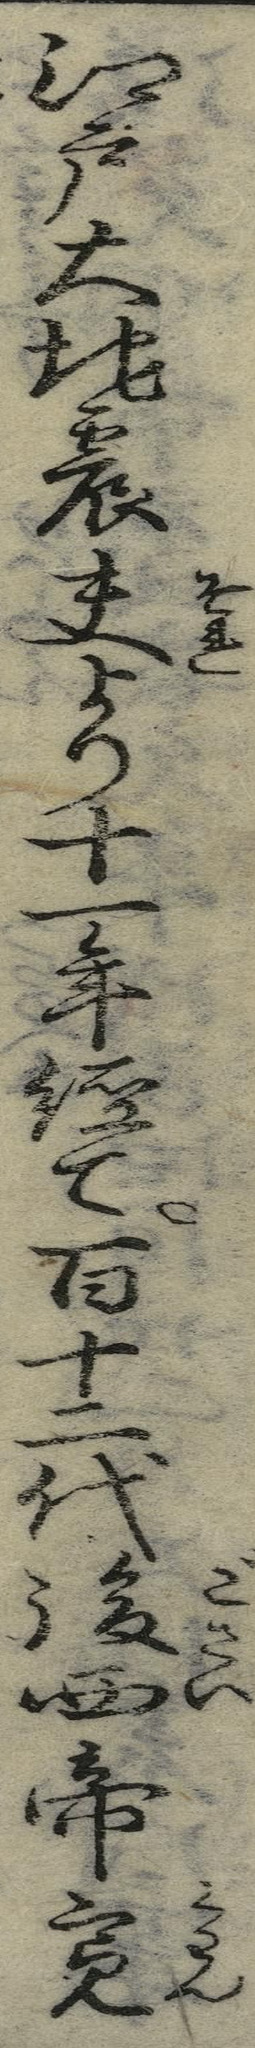江戸大地震夫より十一年経て。百十二代後西帝寛
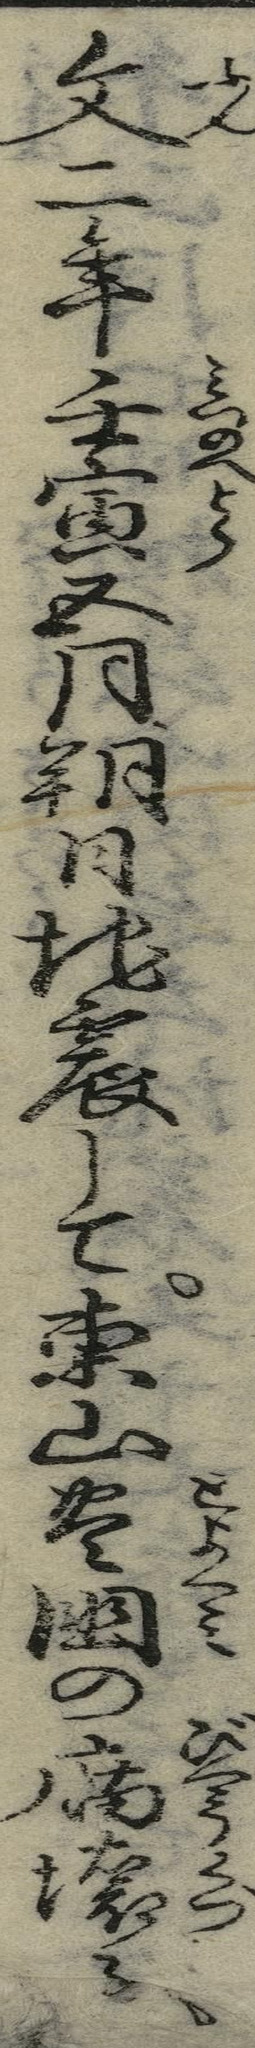文二年壬寅五月朔日地震して。東山豊国の廟壊る、
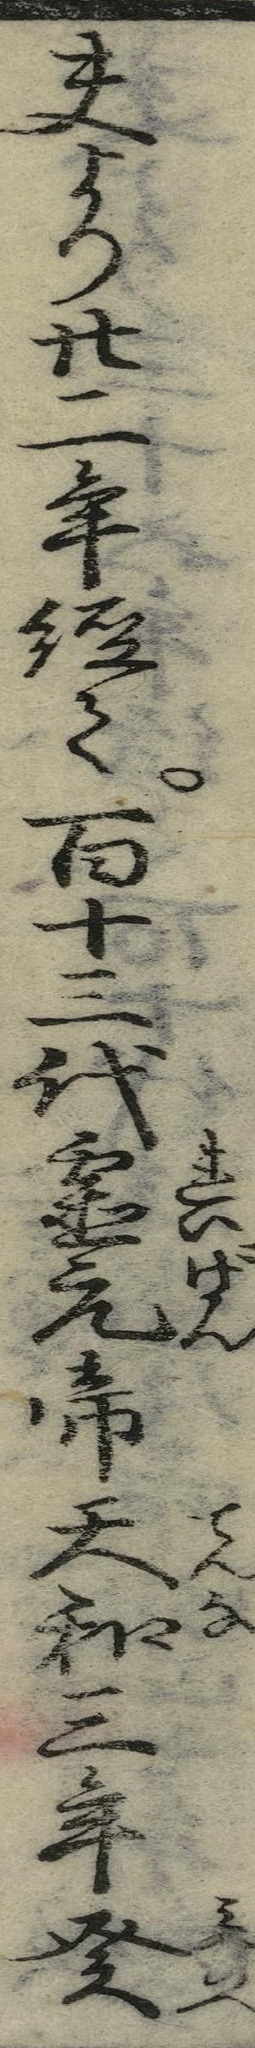夫より廿二年経て。百十三代霊元帝天和三年癸
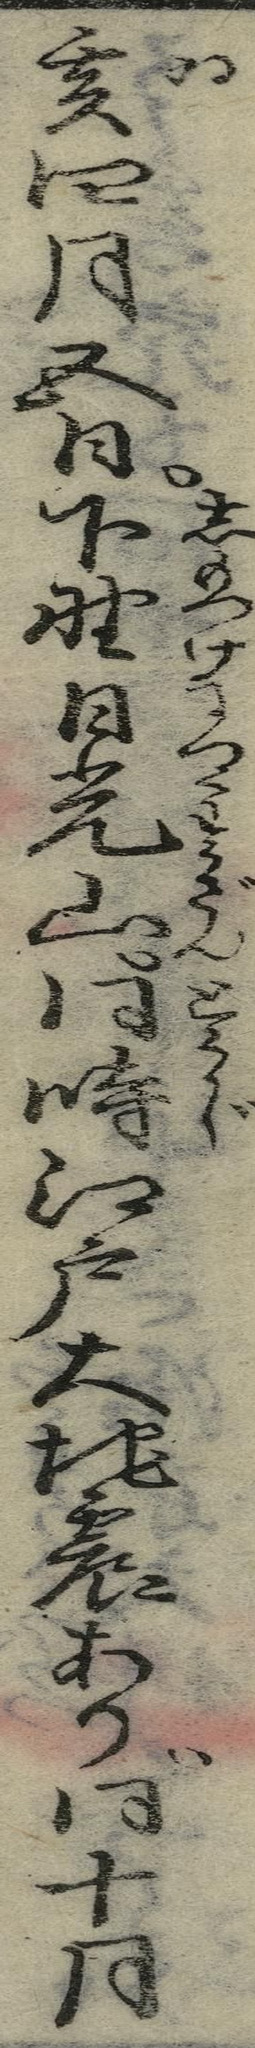亥四月五日。下野日光山。同時江戸大地震あり。同十月
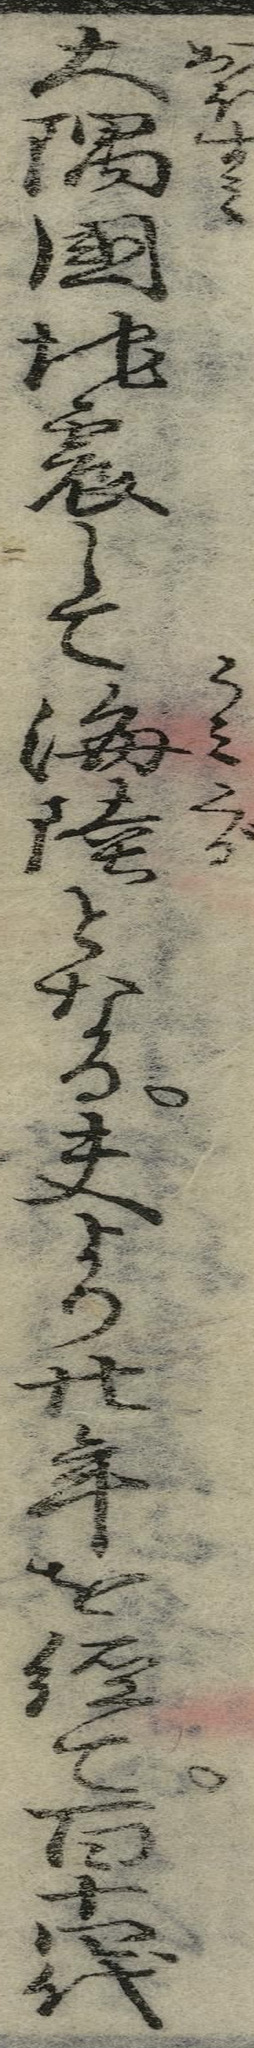大隅国地震して海陸となる。夫より廿年を経て。百十四代
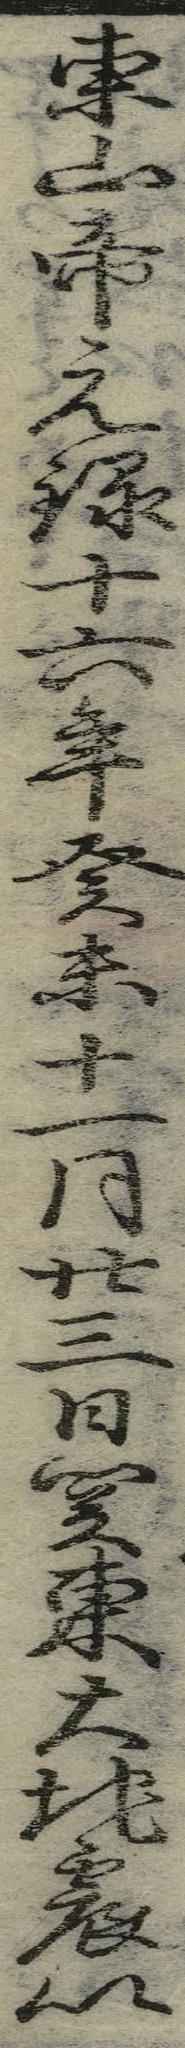東山帝元禄十六年癸未十一月廿三日関東大地震以
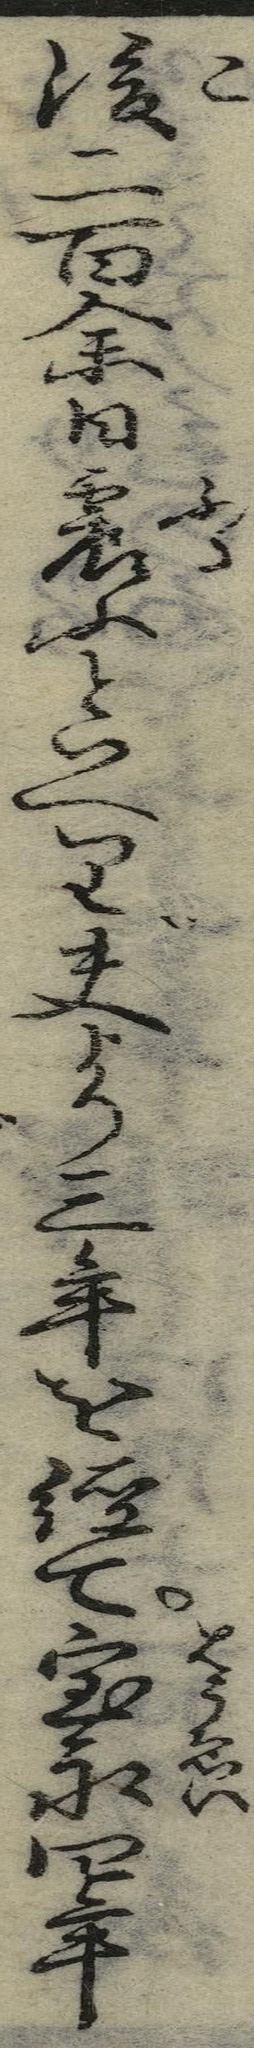後二百余日震ふといへり。夫より三年を経て。宝永四年
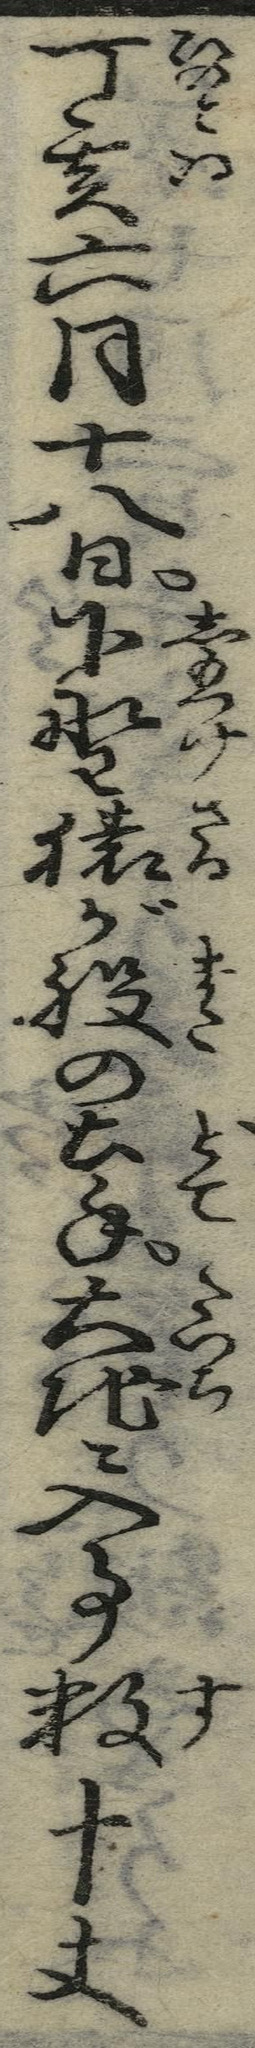丁亥六月十八日。下野猿が股の土手。大地に入事数十丈
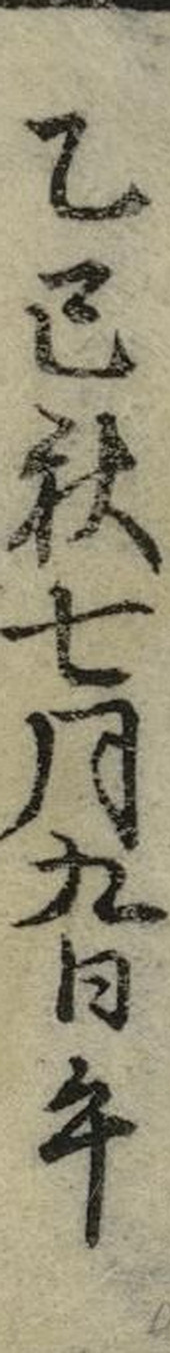乙巳秋七月九日午
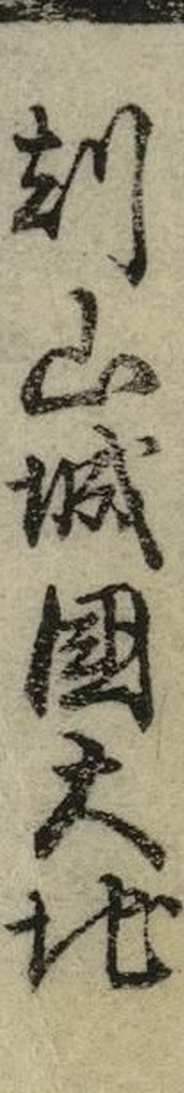刻山城国大地
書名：本朝地震記　全
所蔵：東京大学地震研究所図書室 Earthquake Research Institute Library, The University of Tokyo, JAPAN
